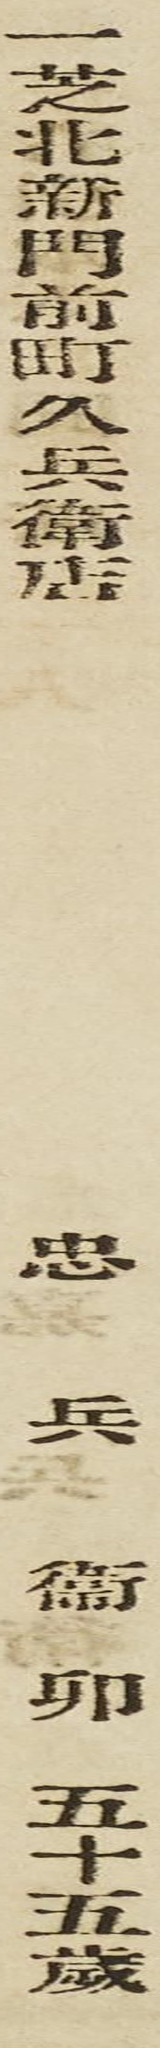一芝北新門前町久兵衛店忠兵衛卯五十五歳
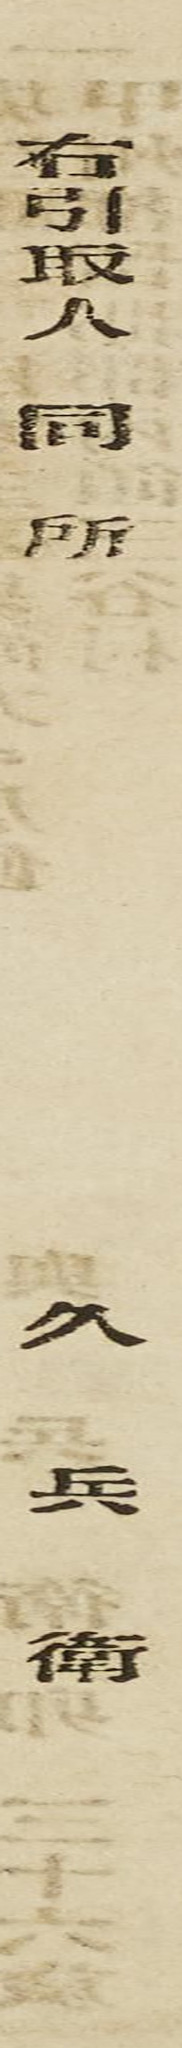右引取人同所久兵衛
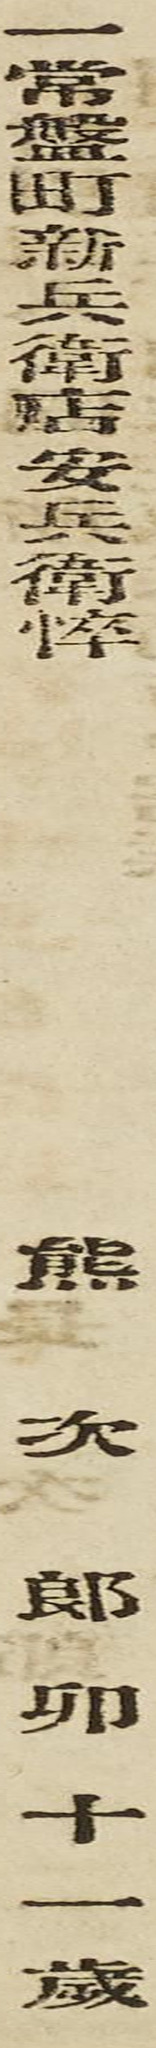一常盤町新兵衛店安兵衛倅熊次郎卯十一歳
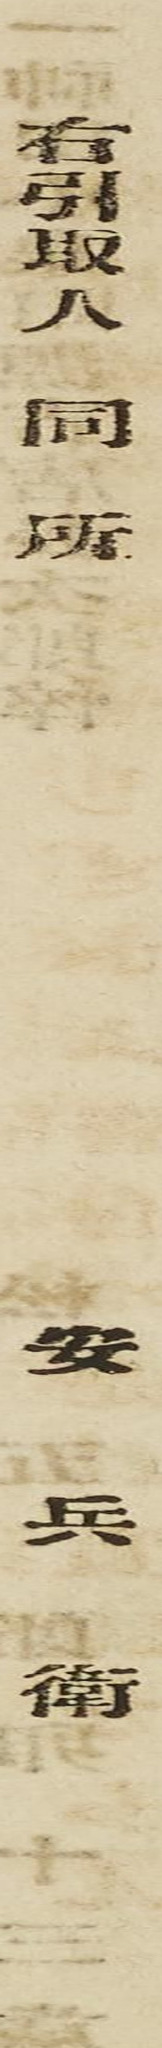右引取人同所安兵衛
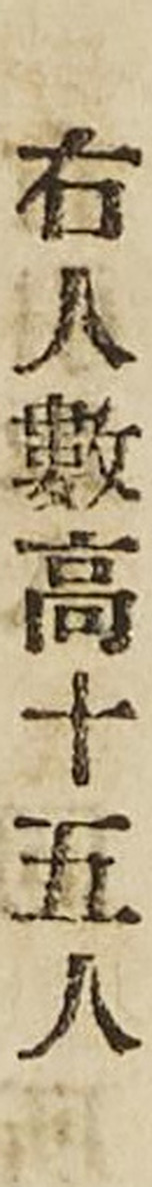右人数高十五人
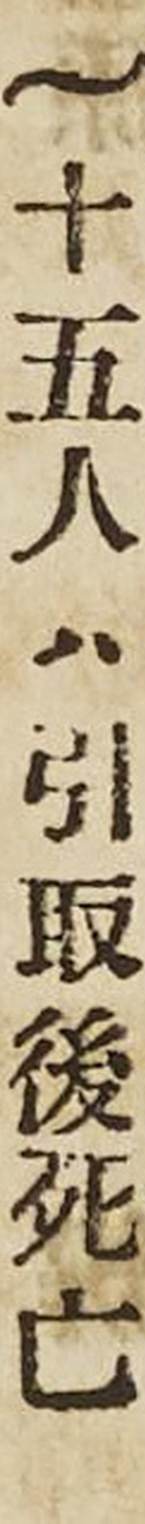十五人は引取後死亡
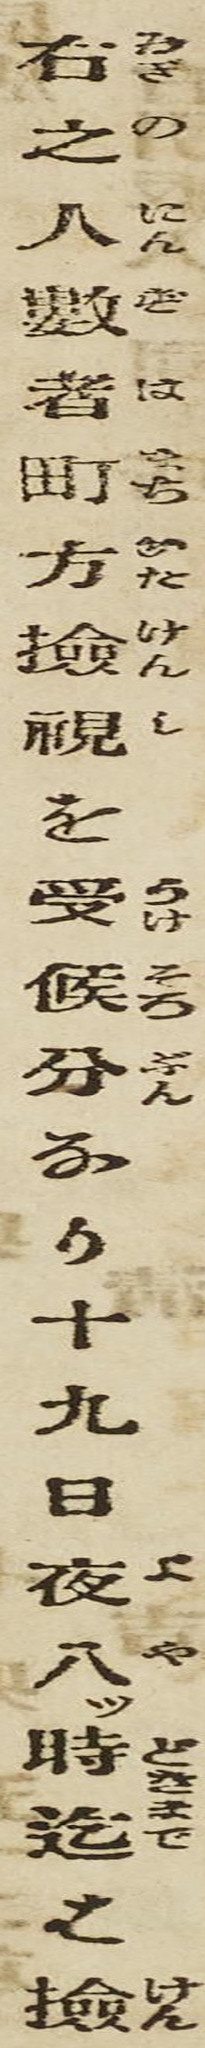右之人数者町方検視を受候分なり十九日夜八ッ時迄は検
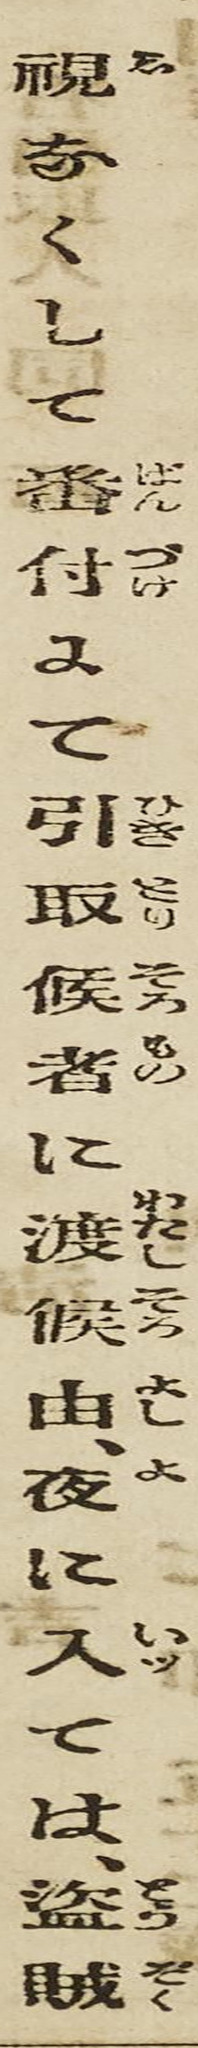視なくして番付にて引取候者に渡候由、夜に入ては、盗賊
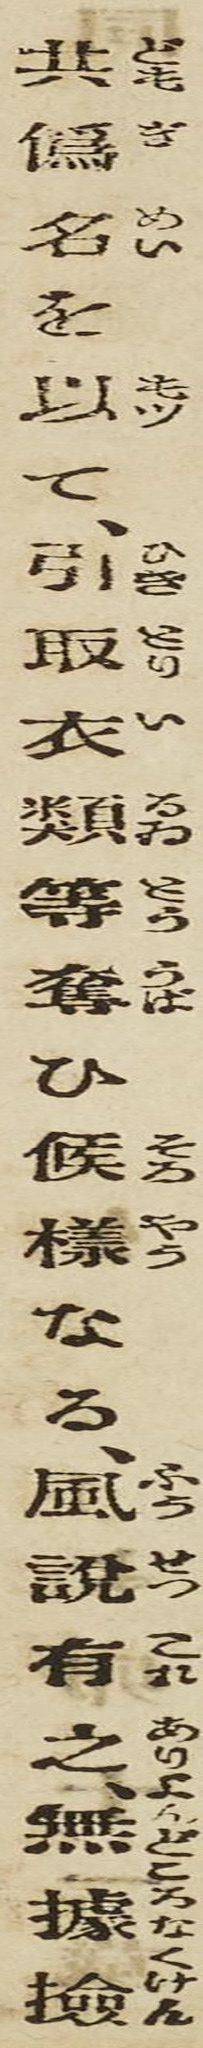共偽名を以て、引取衣類等奪ひ候様なる、風説有之、無拠検
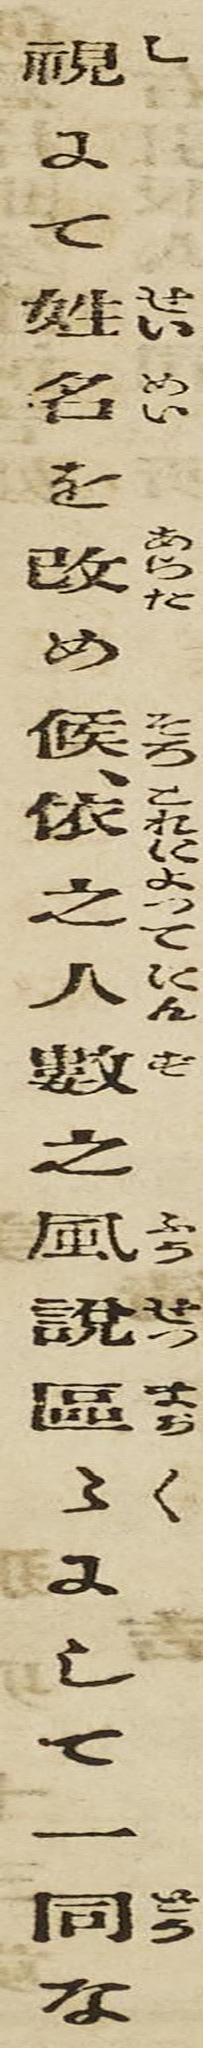視にて姓名を改め候、依之人数之風説区〻にして一同な
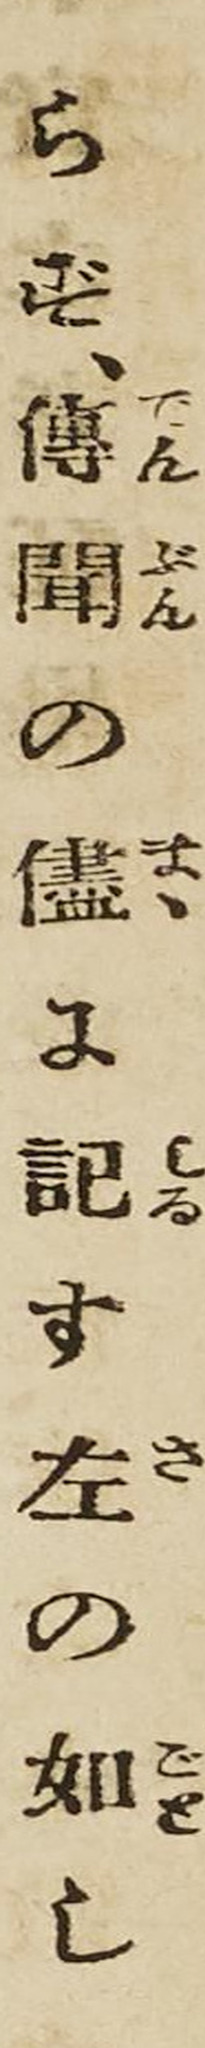らず、伝聞の儘に記す左の如し
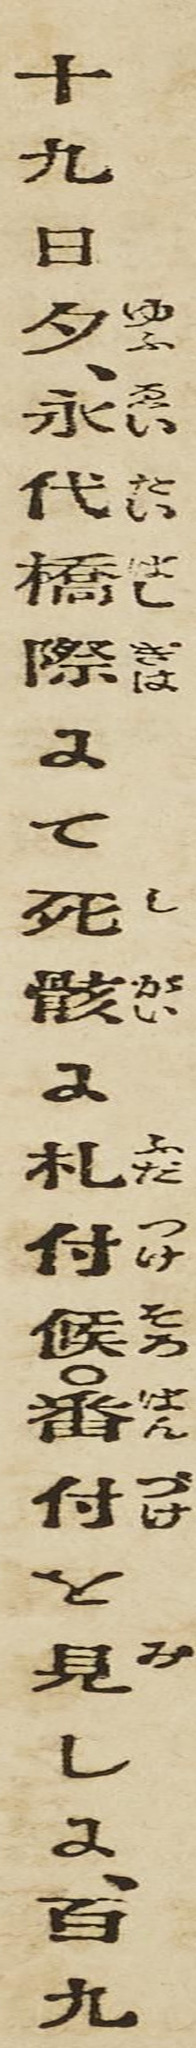十九日夕、永代橋際にて死骸に札付候○番付を見しに、百九
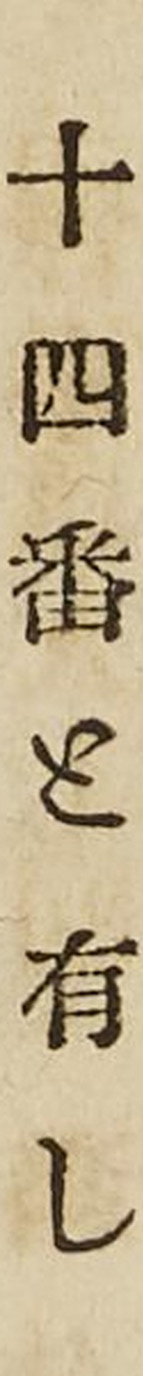十四番と有し
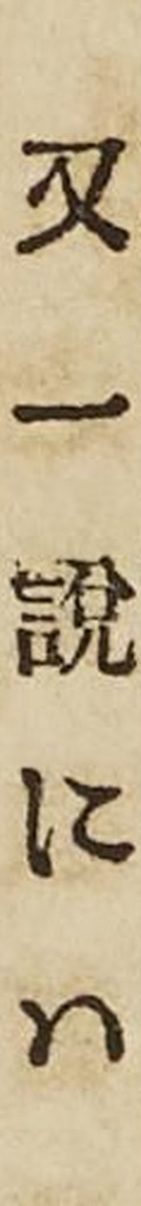又一説には
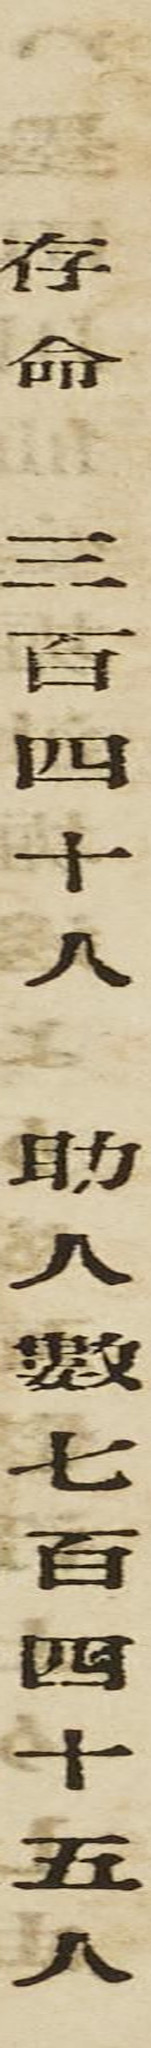存命三百四十人助人数七百四十五人
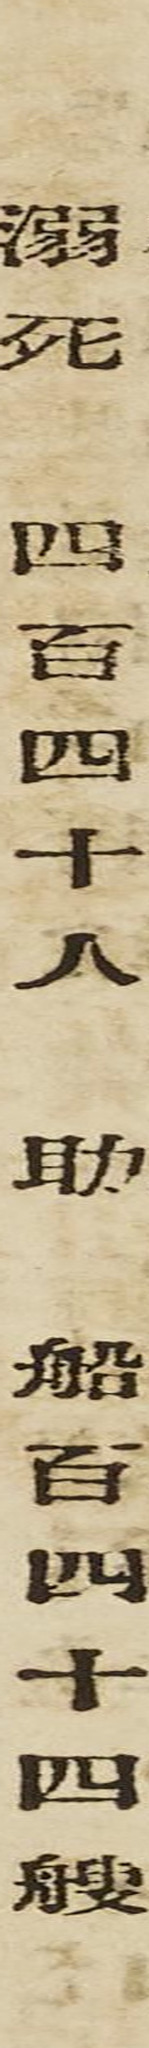溺死四百四十人助船百四十四艘
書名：永代惨話　文化の夢　全
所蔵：東京大学地震研究所図書室 Earthquake Research Institute Library, The University of Tokyo, JAPAN
